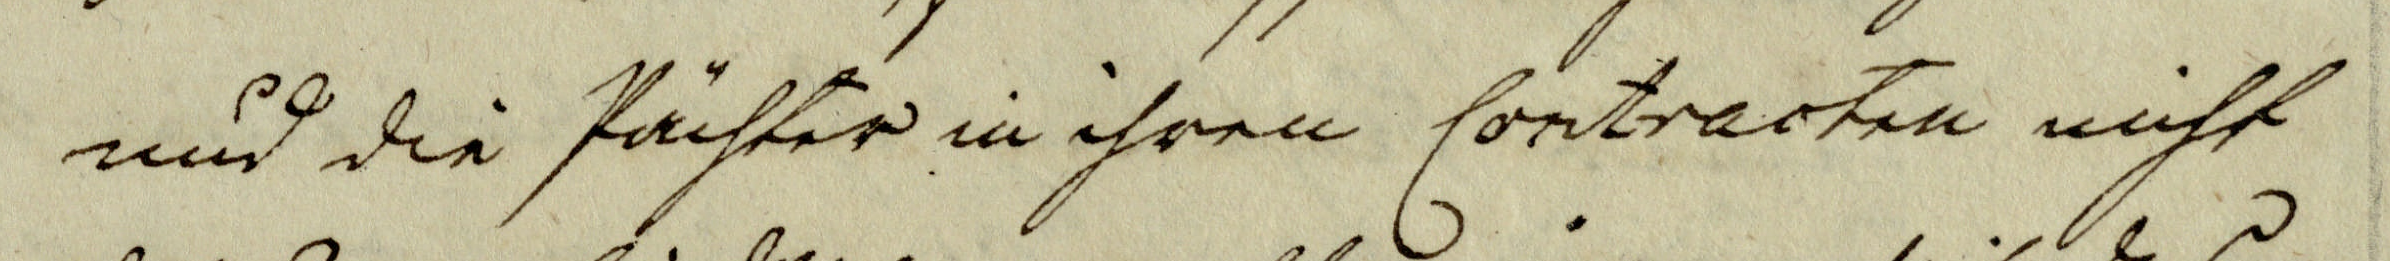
und die Pächter in ihren Contracten nicht
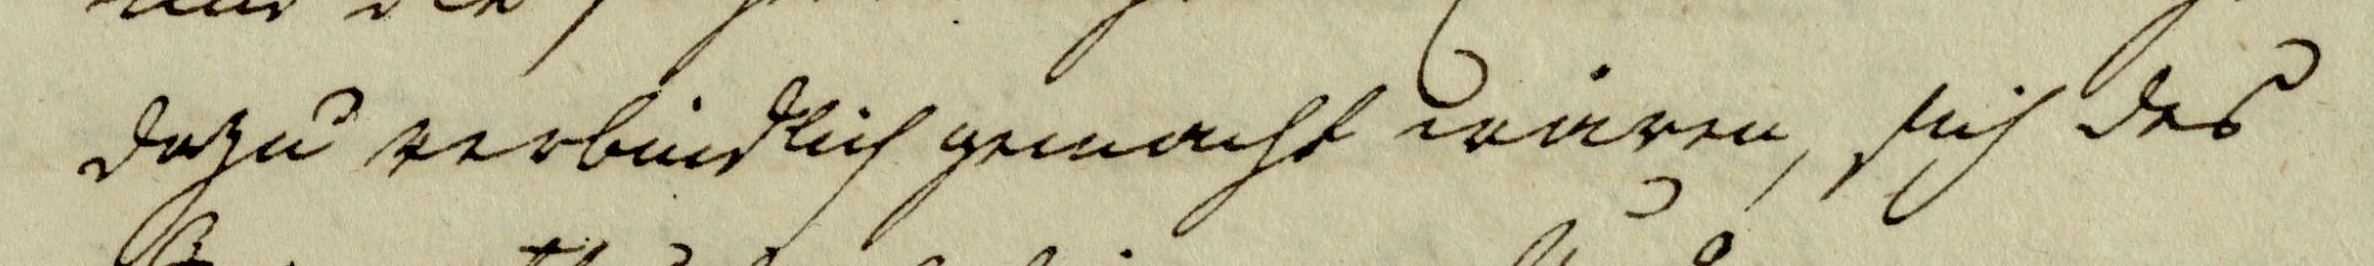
dazu verbindlich gemacht wären, sich des
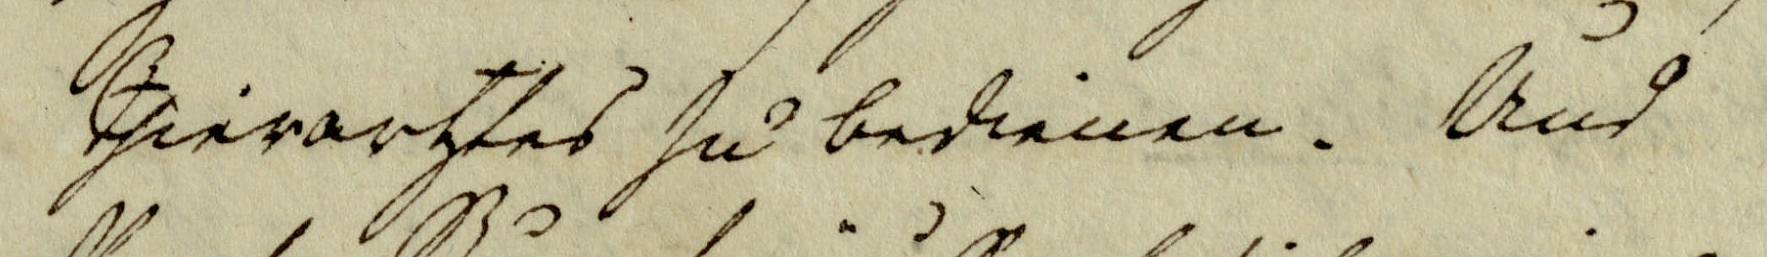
Thierartztes zu bedienen. Und
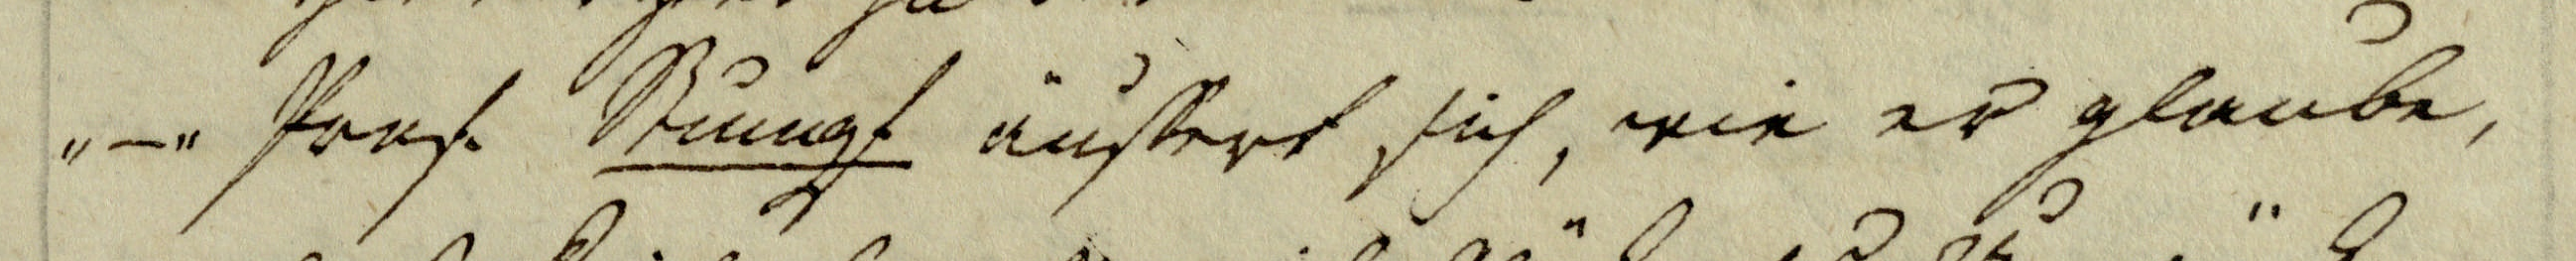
Prof. Stumpf äussert sich, wie er glaube,
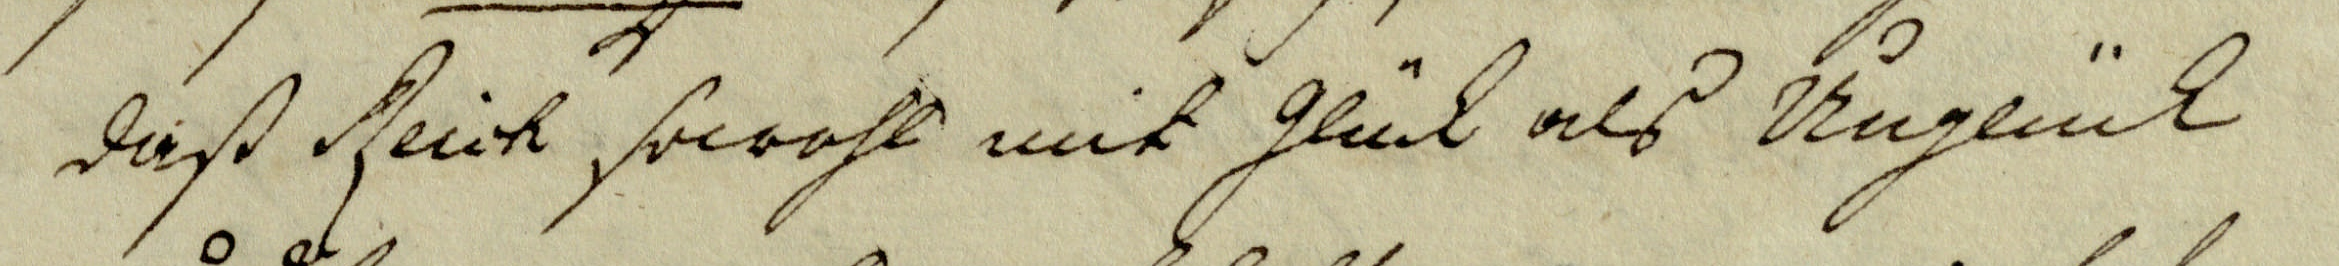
daß Reich sowohl mit Glück als Unglück
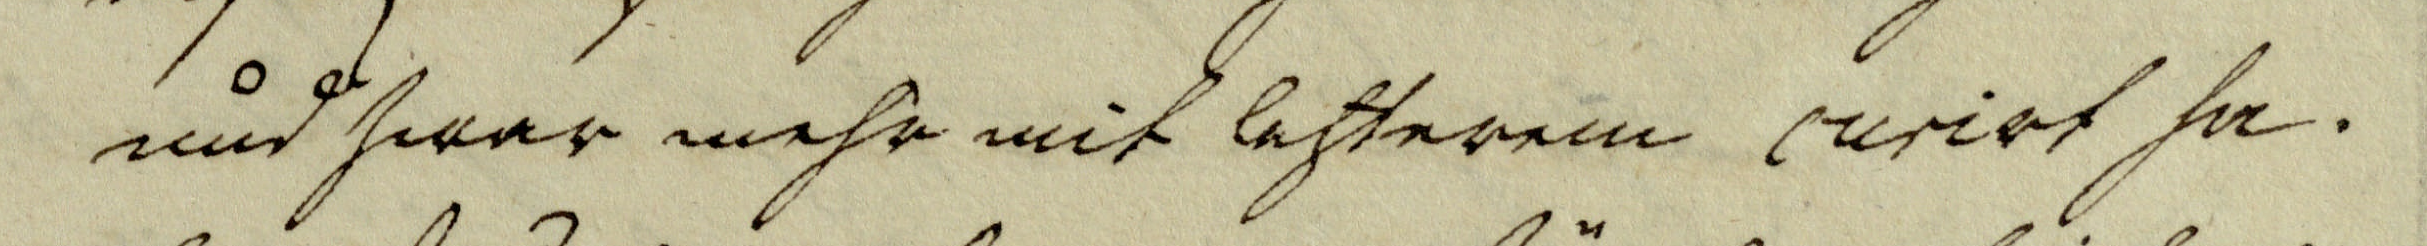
und zwar mehr mit letzterem curirt ha¬
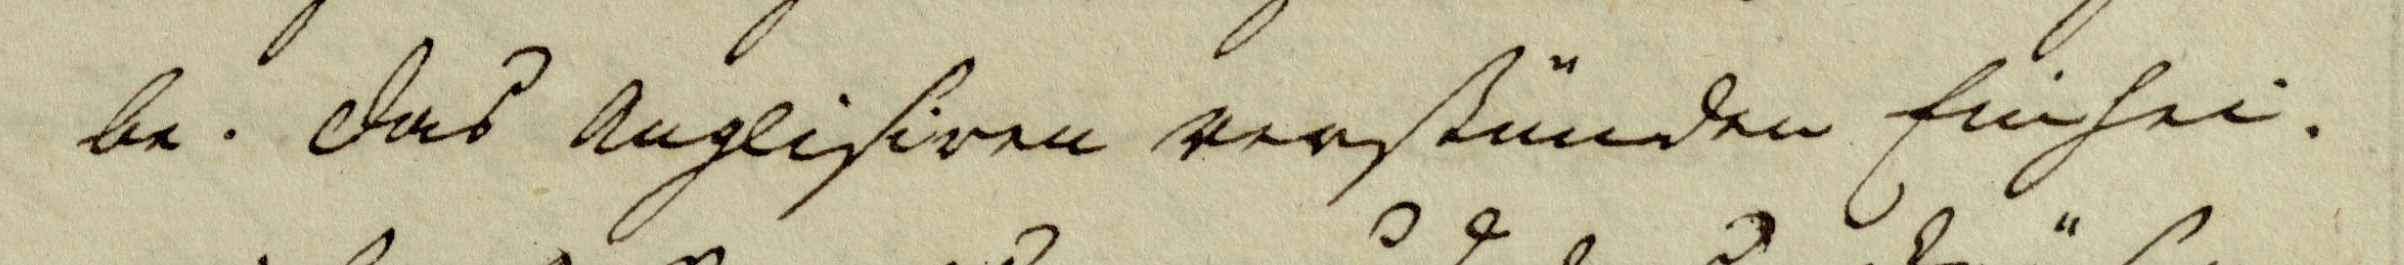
be. Das Anglisiren verstünden Einhei¬
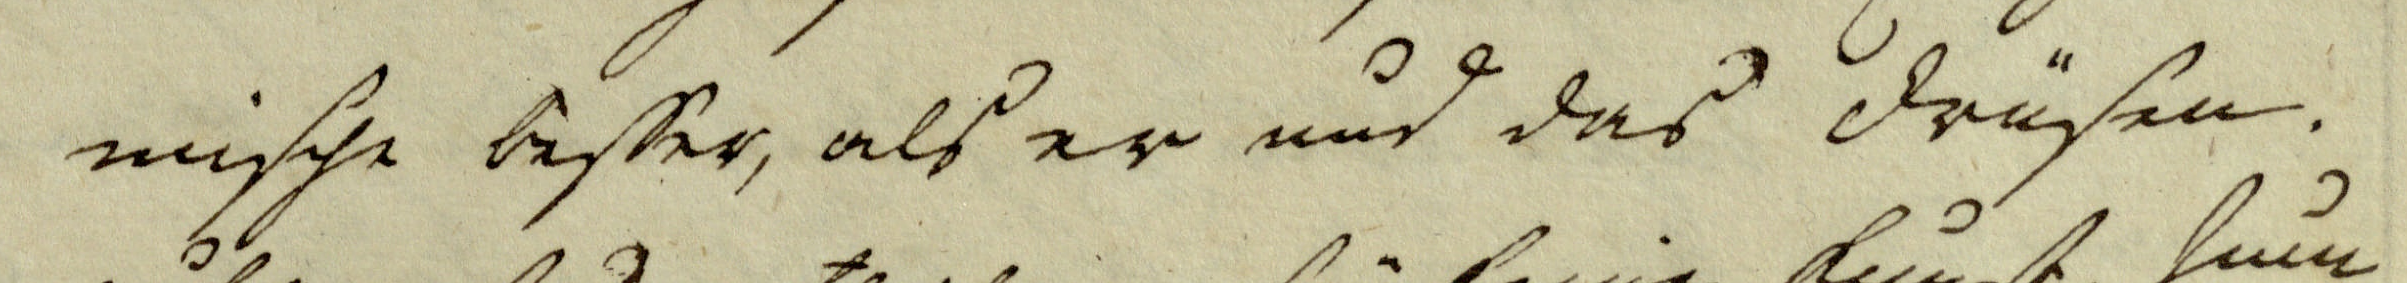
mische besser, als er und das Drüsen¬
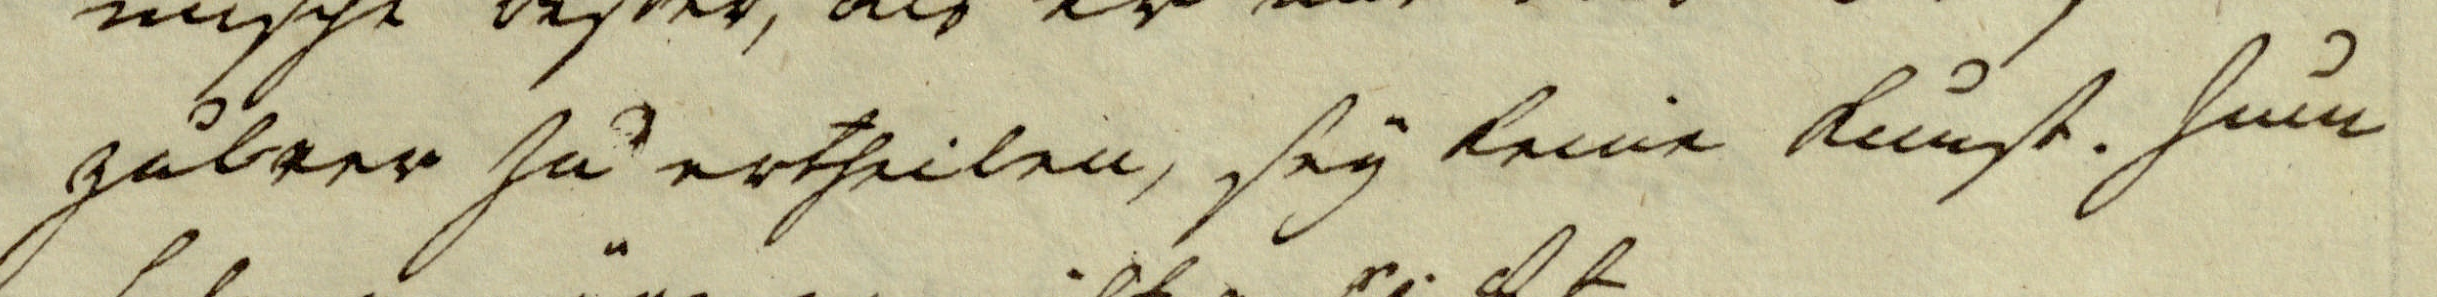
pulver zu ertheilen, seÿ keine Kunst. Zum
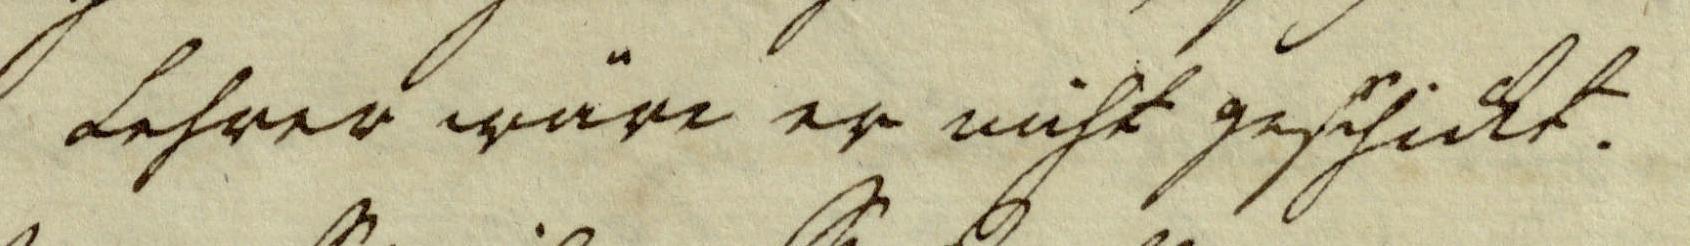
Lehrer wäre er nicht geschickt.
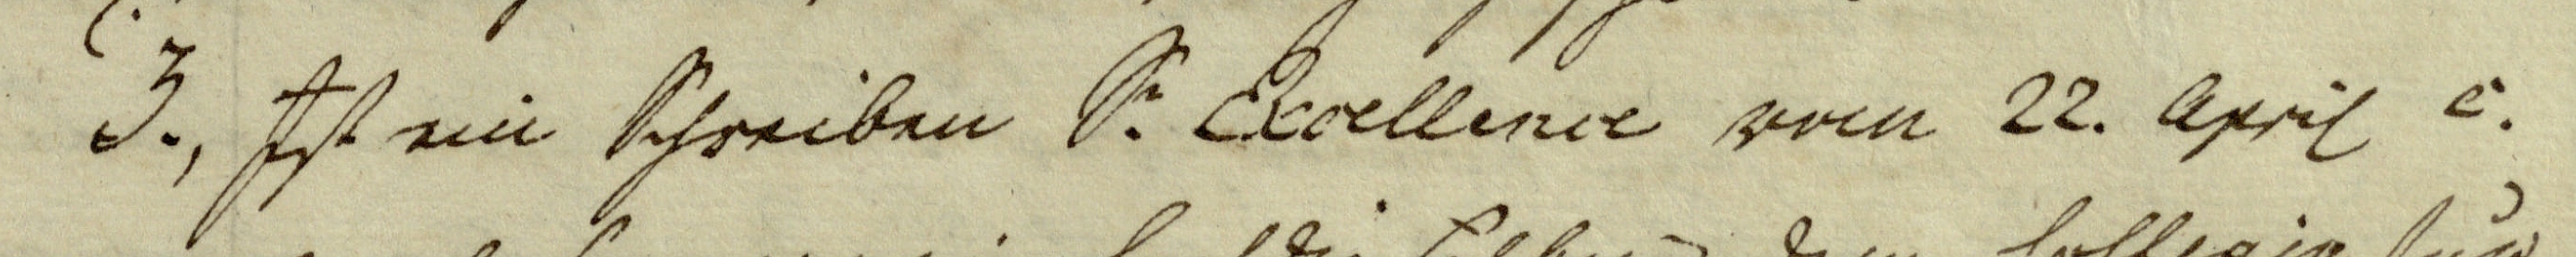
3., Ist ein Schreiben Sr Excellence vom 22. April c.
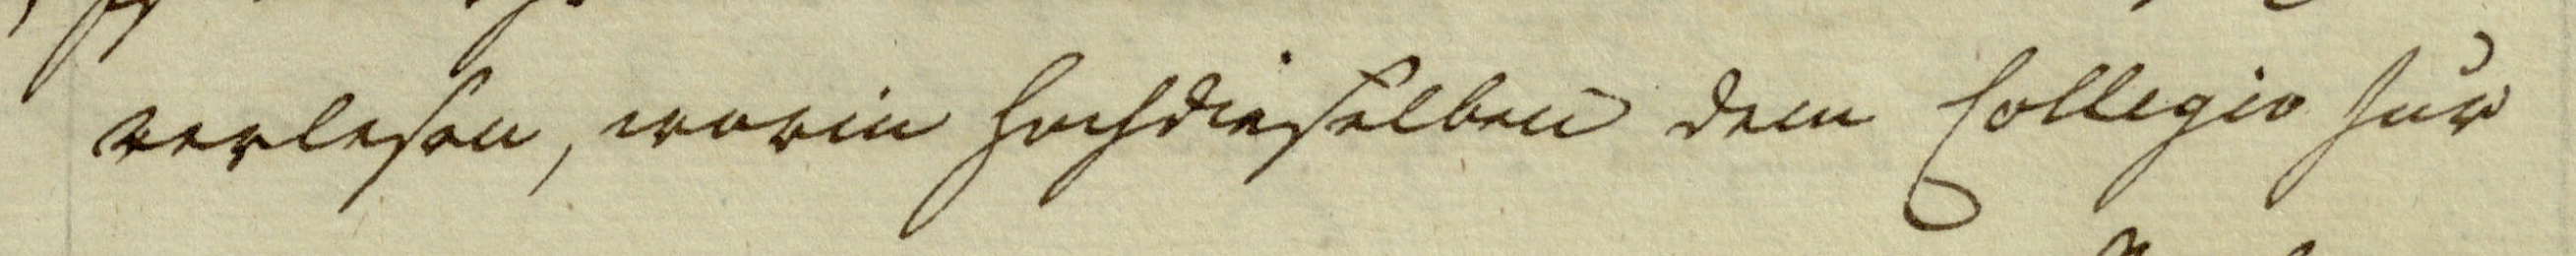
verlesen, worin Hochdieselben dem Collegio zur
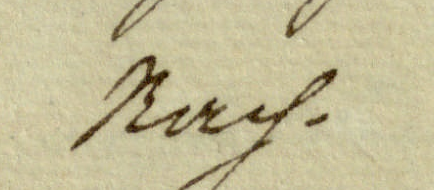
Nach¬
